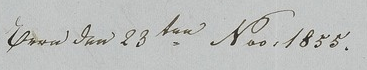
Bern den 23ten Nov. 1855.
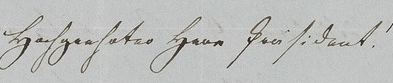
Hochgeehrter Herr Präsident!
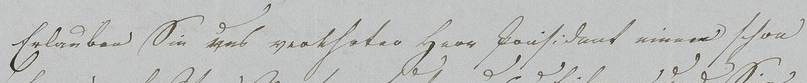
Erlauben Sie uns verehrter Herr Präsident einen schon
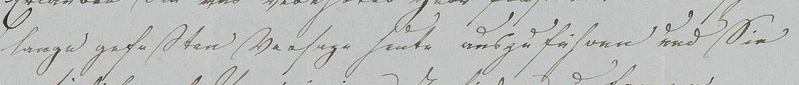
lange gefaßten Vorsaze heute auszuführen und Sie
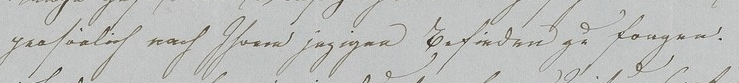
persönlich nach Ihrem jezigen Befinden zu fragen.
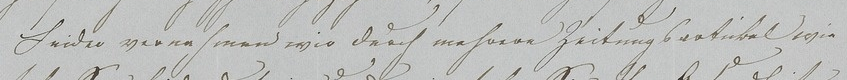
Leider vernehmen wir durch mehrere Zeitungsartikel wie
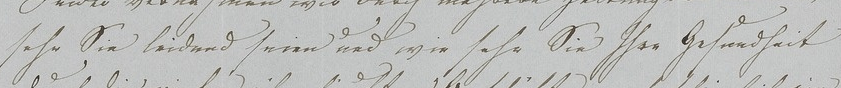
sehr Sie leidend seien und wie sehr Sie Ihre Gesundheit
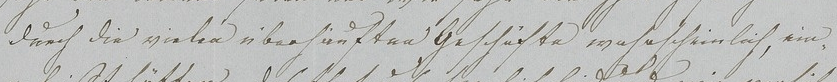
durch die vielen überhäuften Geschäfte wahrscheinlich, ein-
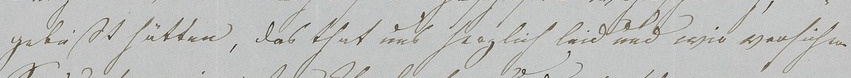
gebüßt hätten, das that uns herzlich leid und wir versichern
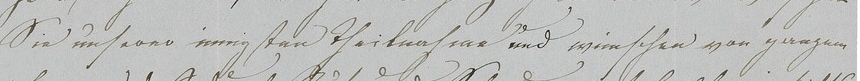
Sie unserer innigsten Theilnahme und wünschen von ganzem
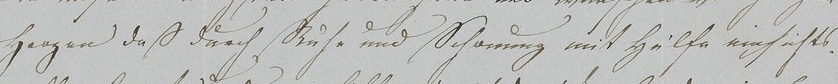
Herzen daß durch Ruhe und Schonung mit Hülfe einsichts-
